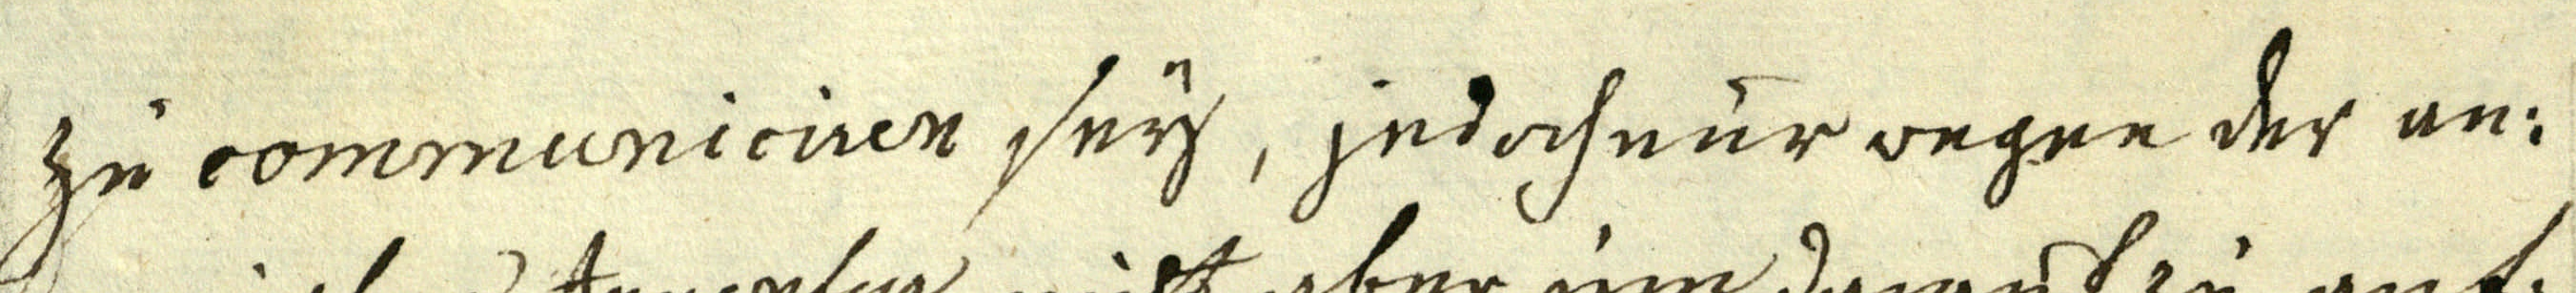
zu communiciren seÿ, jedoch nur wegen der an¬
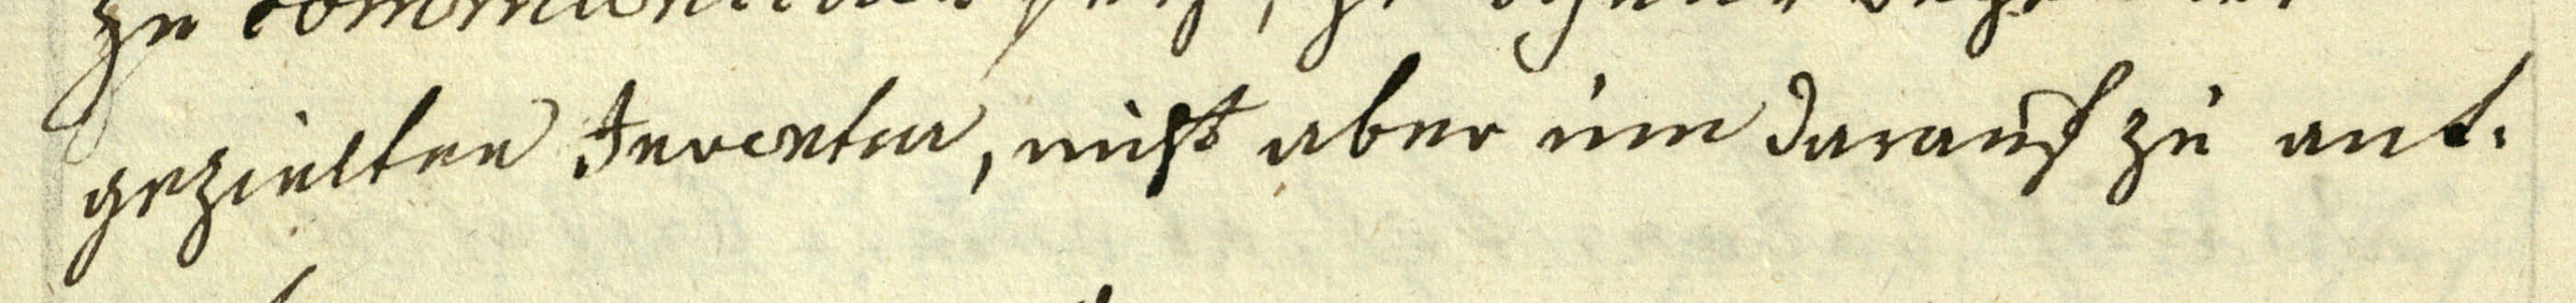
gezielten Inventur, nicht aber um darauf zu ant¬
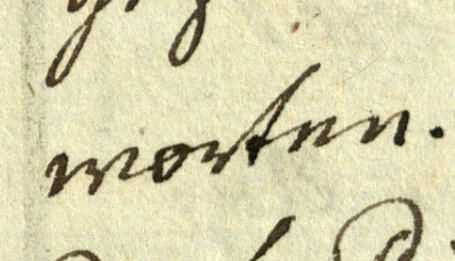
worten.
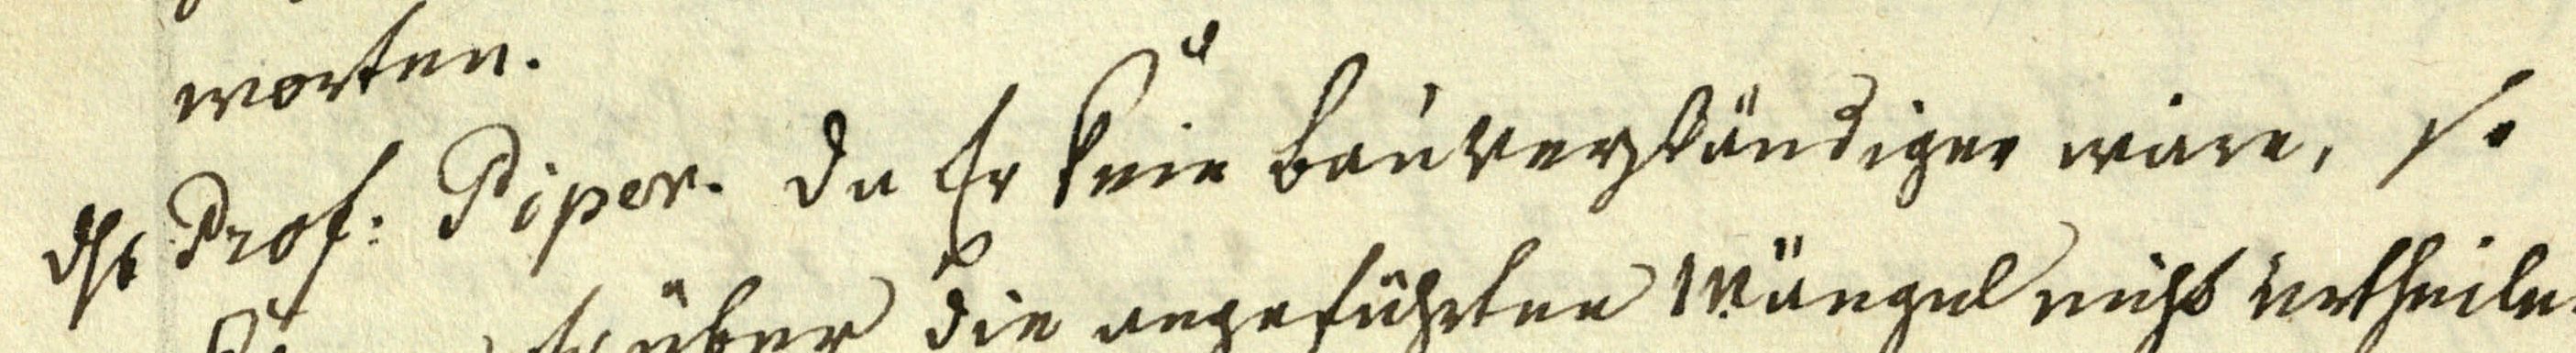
dh Prof. Piper. Da Er kein Bauverständiger wäre, so
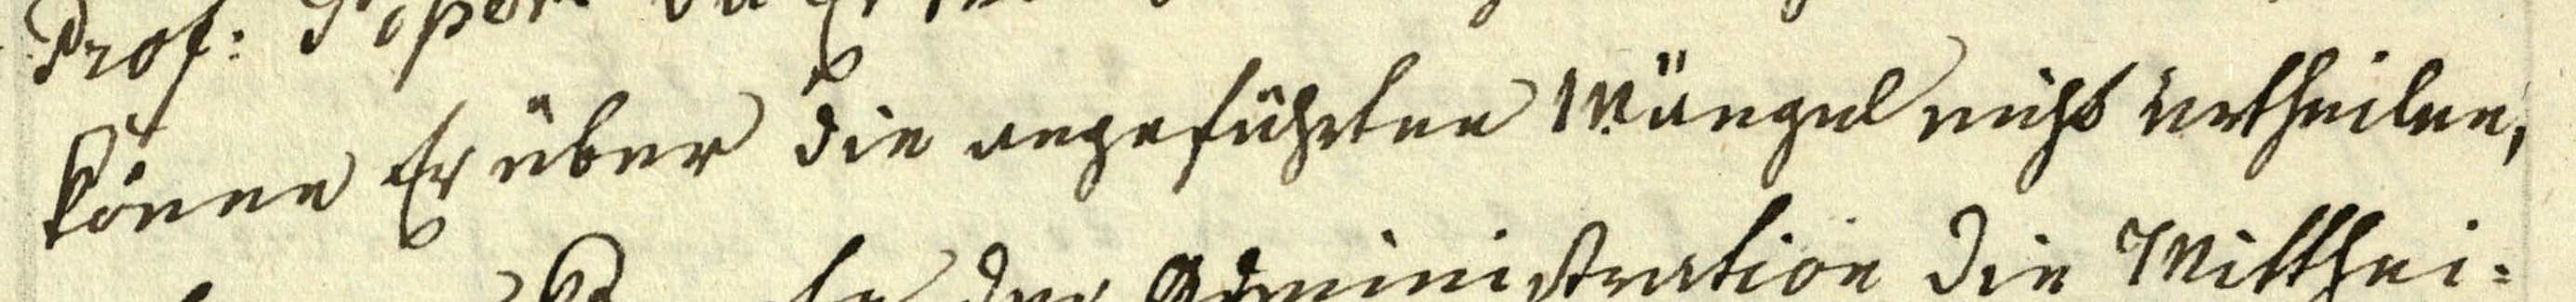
könne Er über die angeführten Mängel nicht urtheilen,
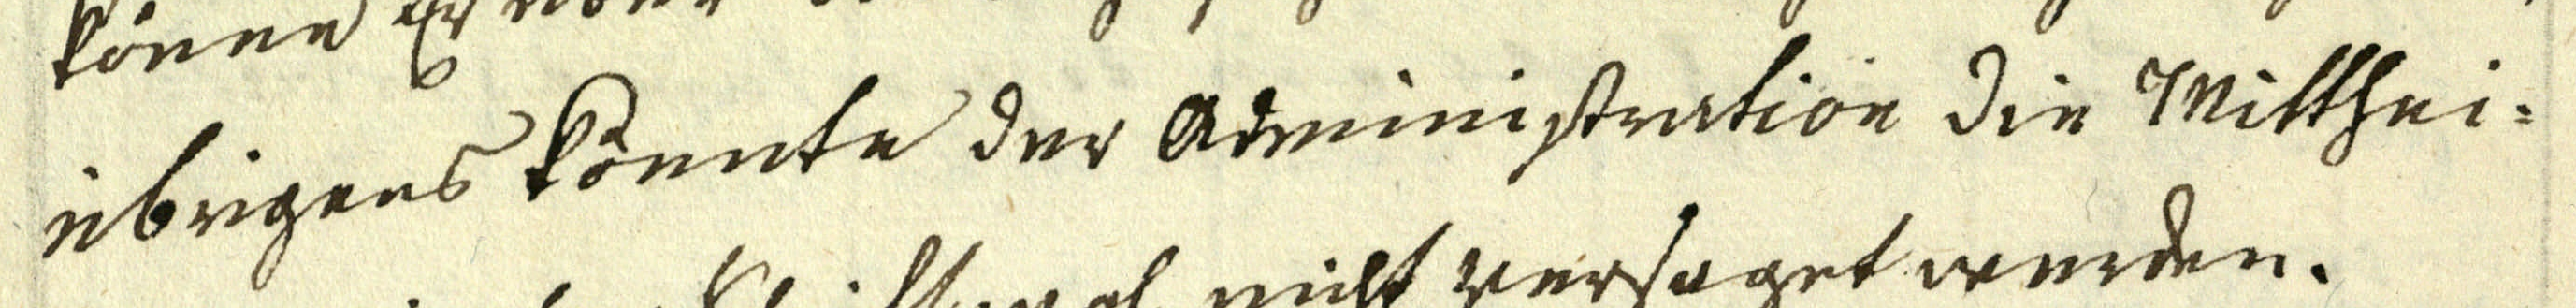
übrigens könnte der Administration die Mitthei¬
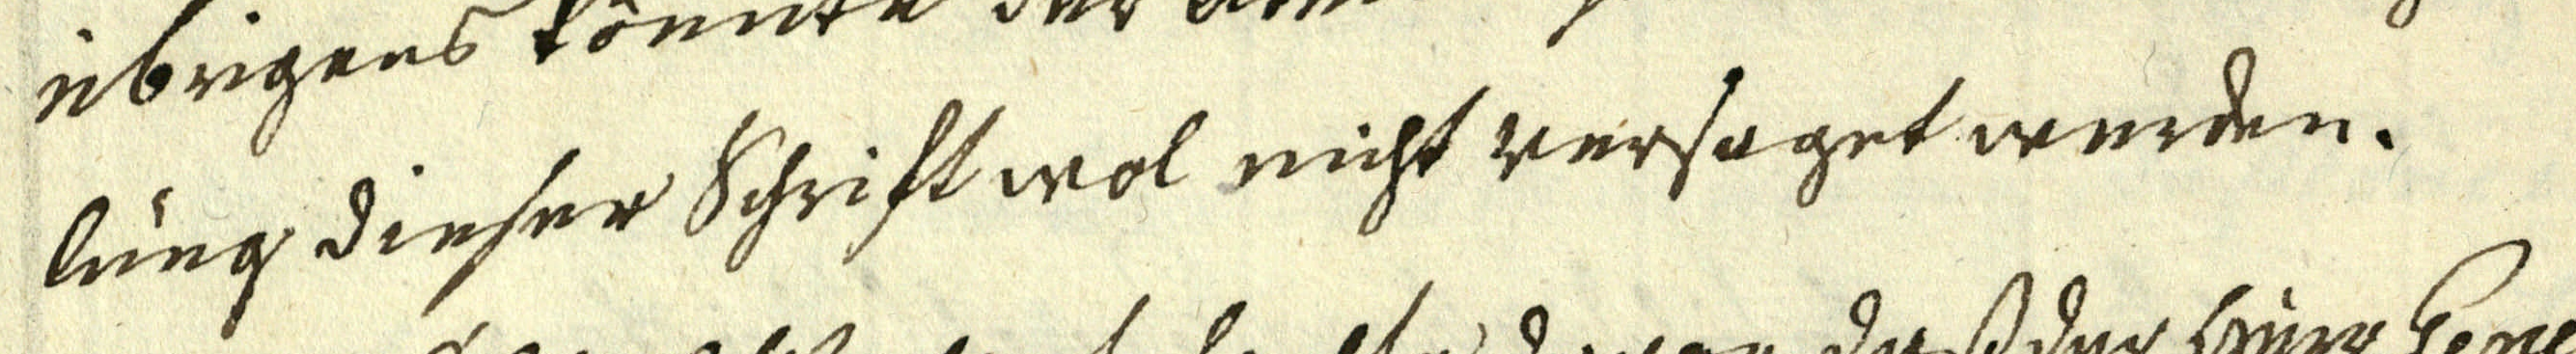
lung dieser Schrift wol nicht versaget werden.
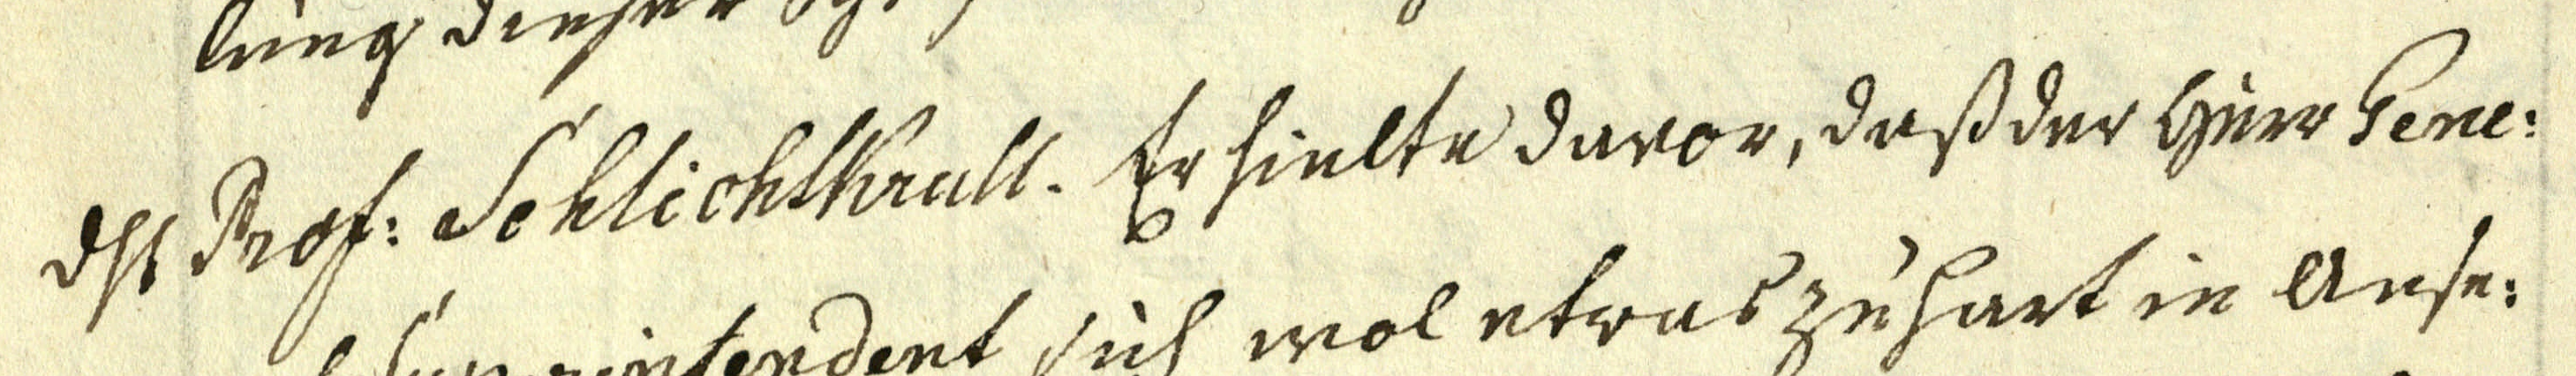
dh Prof: Schlichtkrull. Er hielte davor, daß der Herr Gene¬
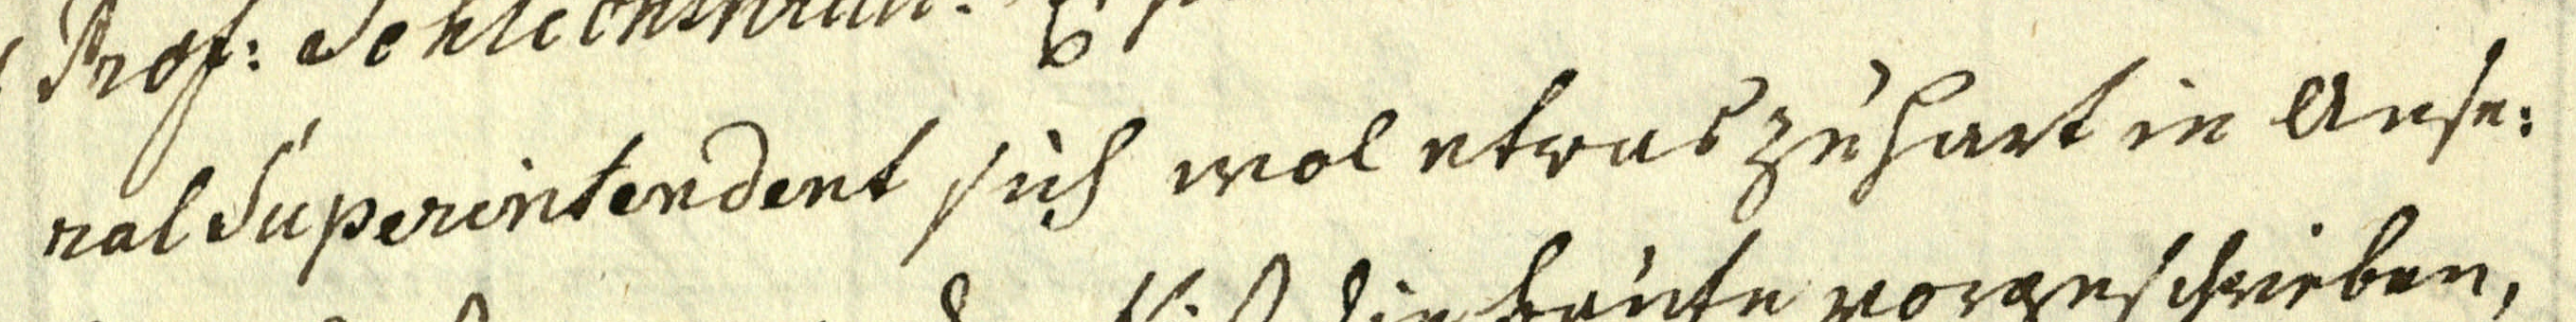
nal Superintendent sich wol etwas zu hart in Anse¬
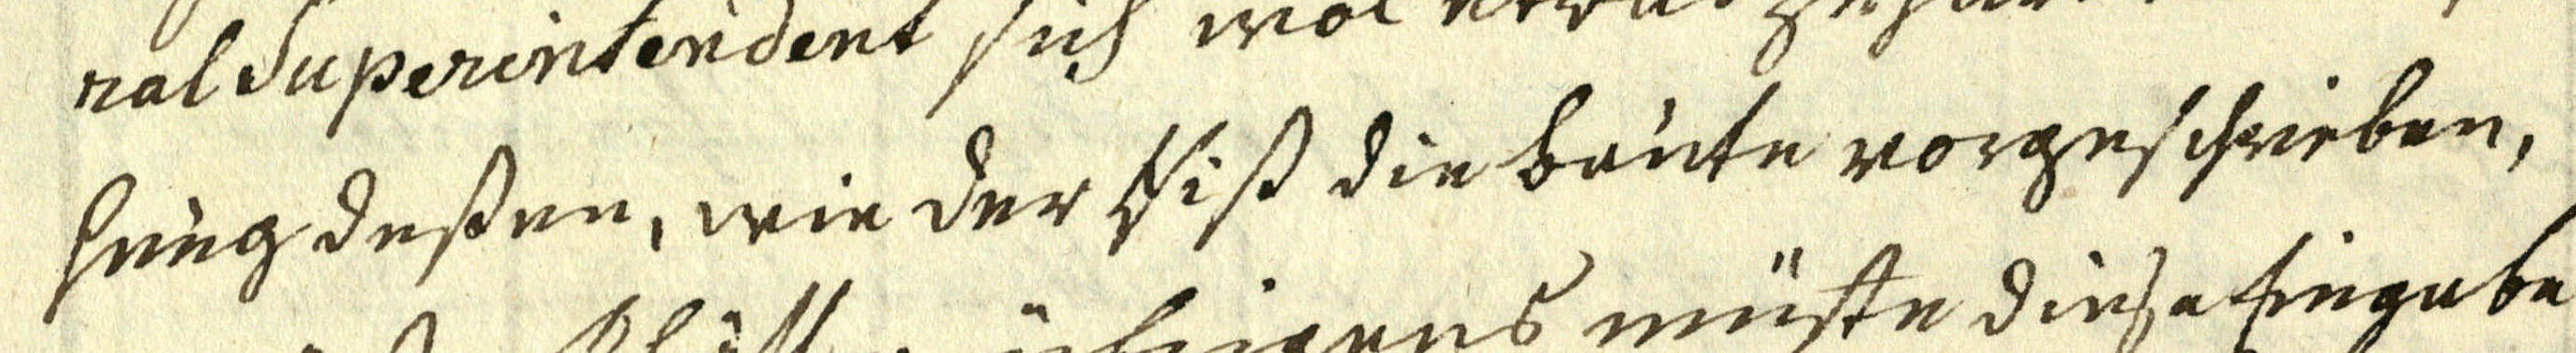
hung deßen, wie der Riß die Baute vorgeschrieben,
